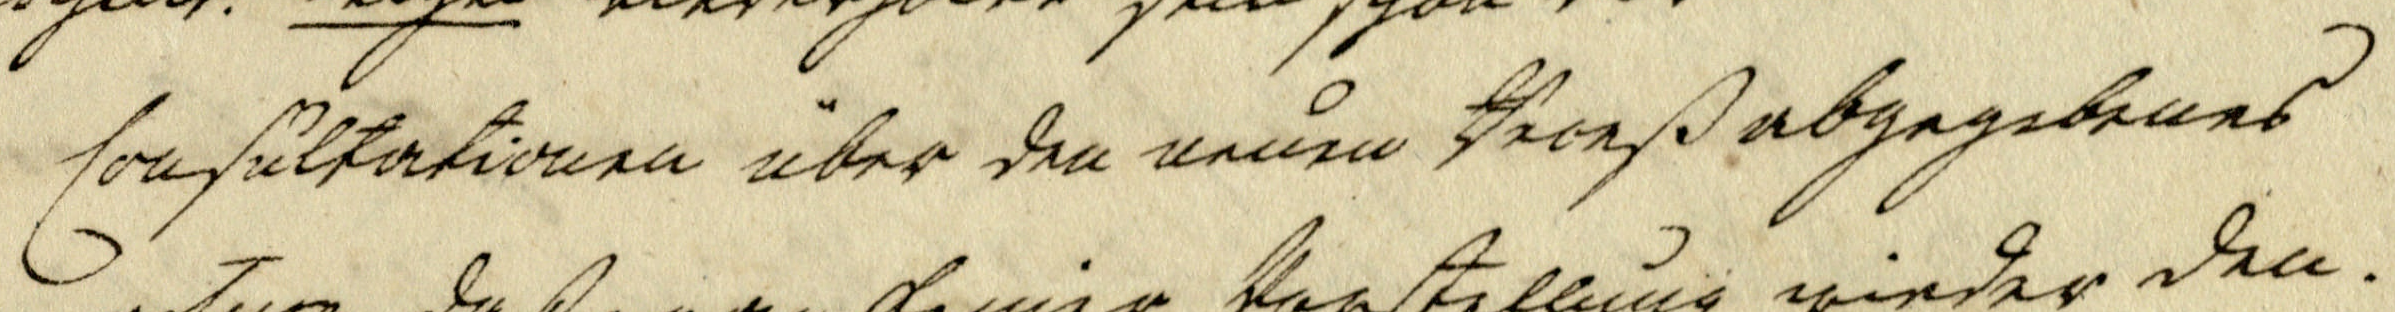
Consultationen über den neuen Receß abgegebenes
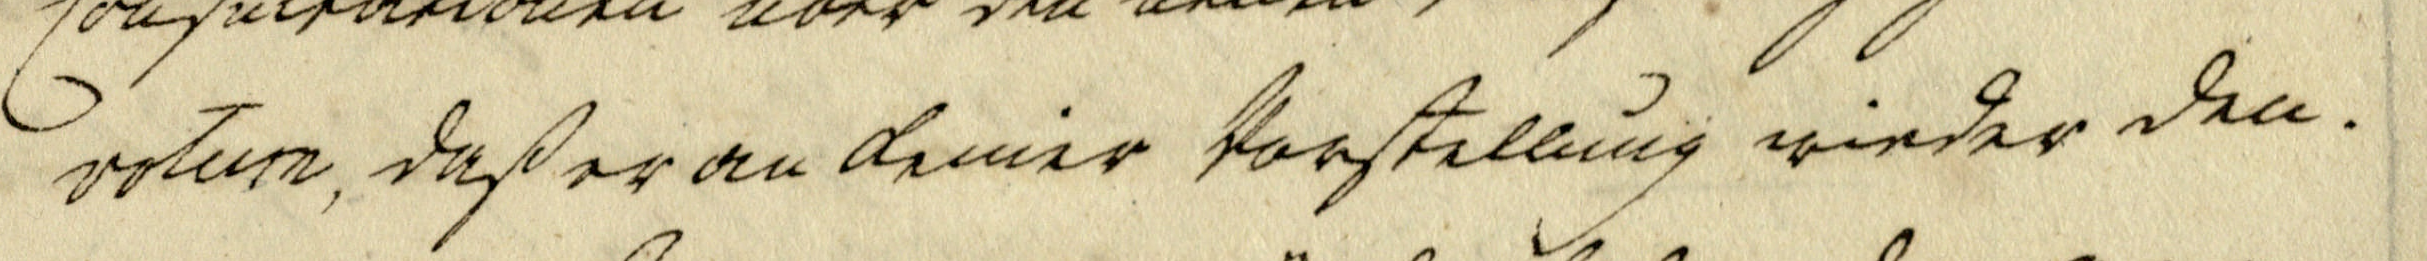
votum, daß er an keiner Vorstellung wieder den¬
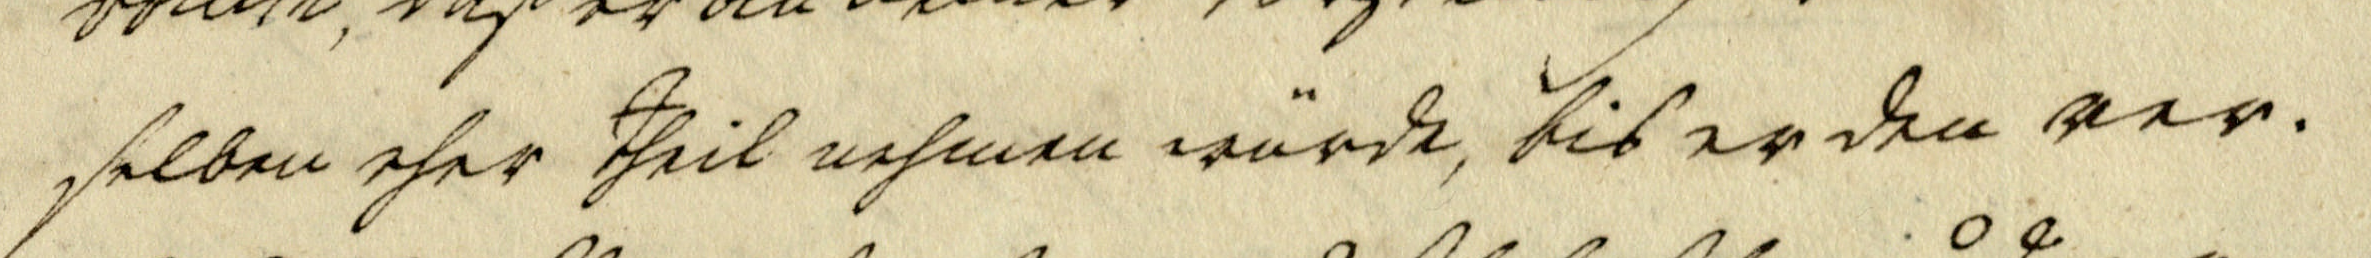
selben eher Theil nehmen würde, bis er den ver¬
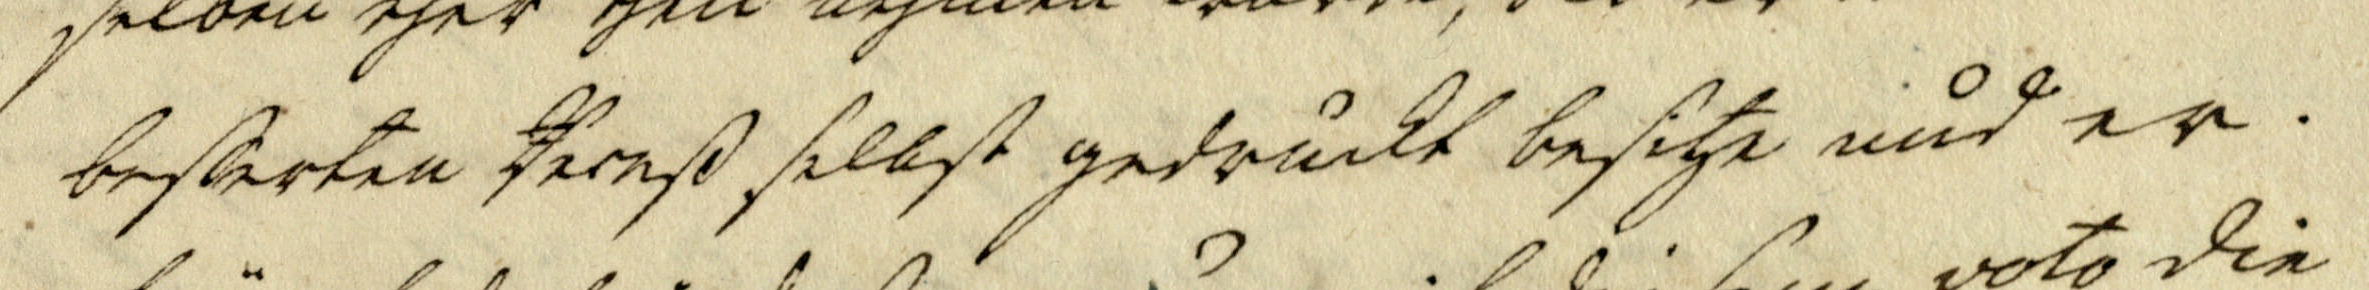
besserten Receß selbst gedruckt besitze und er¬
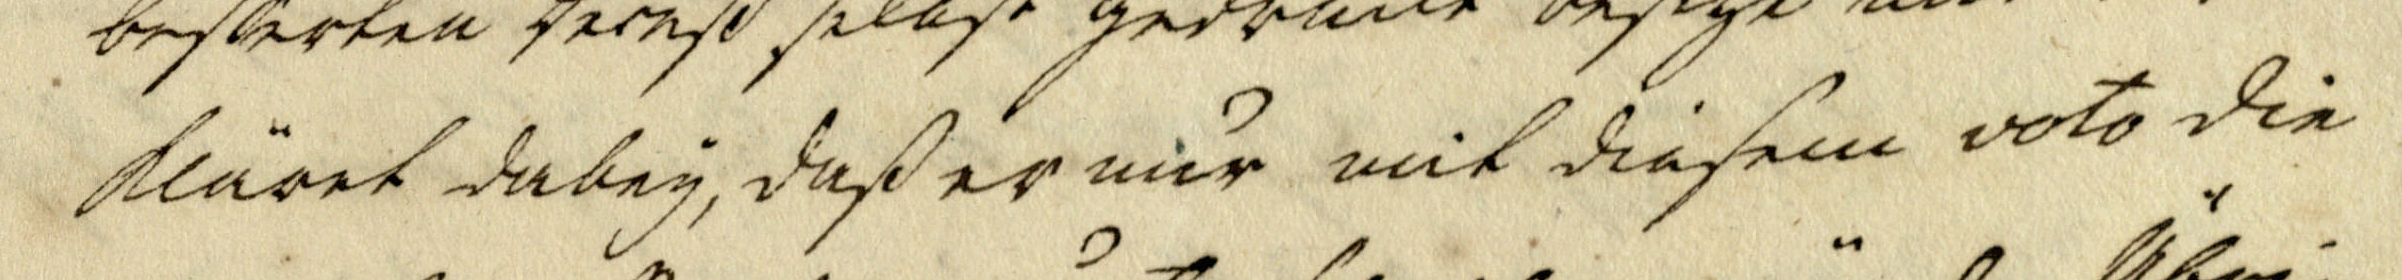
kläret dabey, daß er nur mit diesem voto die
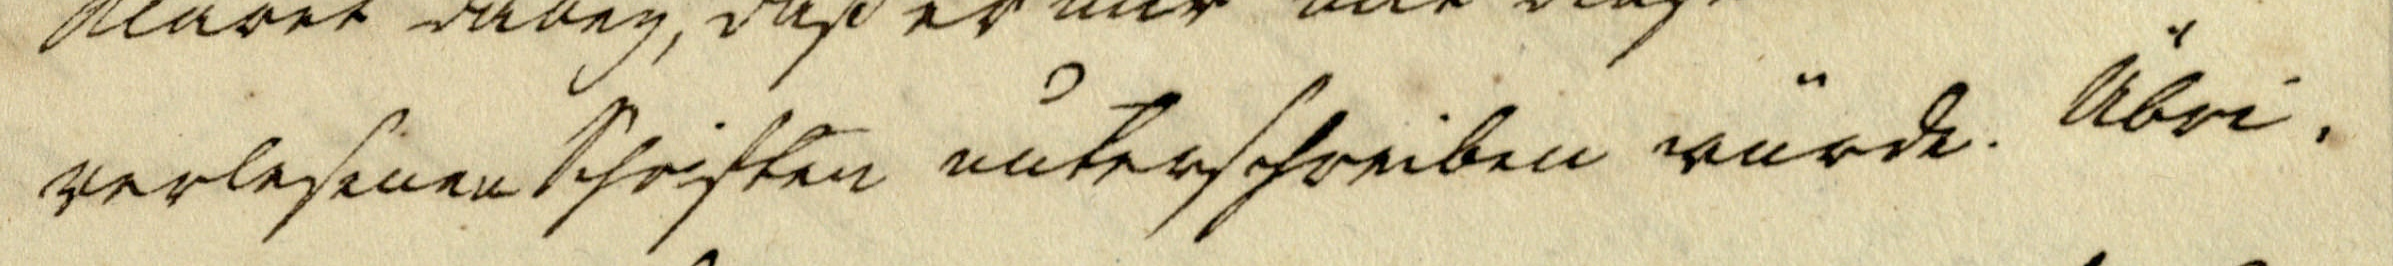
verlesenen Schriften unterschreiben würde. Übri¬
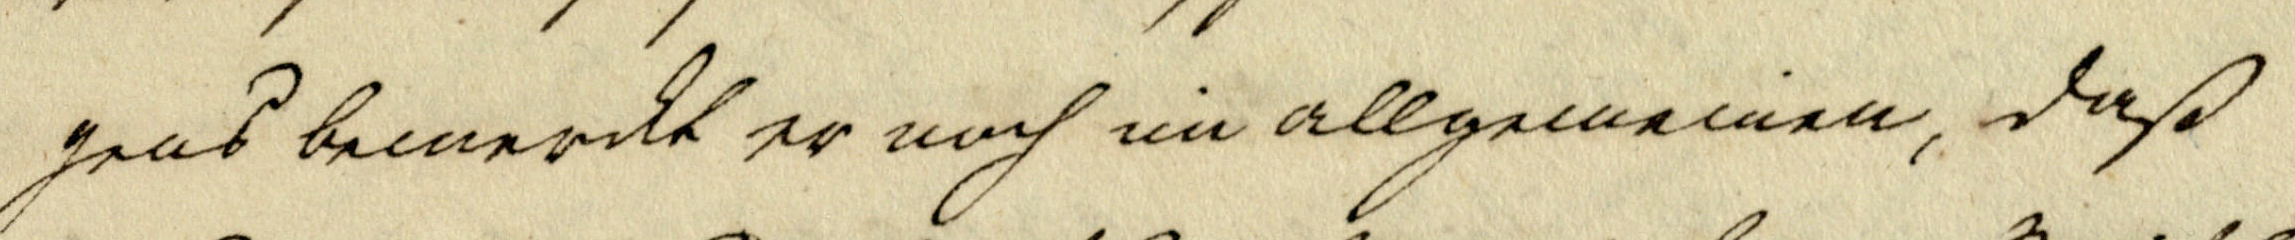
gens bemerckt er noch im allgemeinen, daß
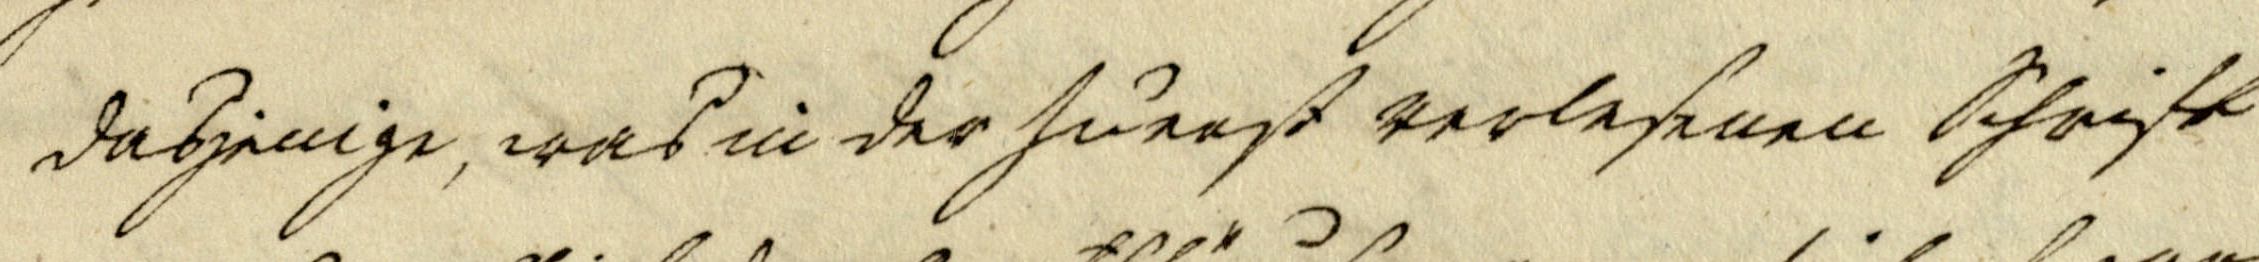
dasjenige, was in der zuerst verlesenen Schrift
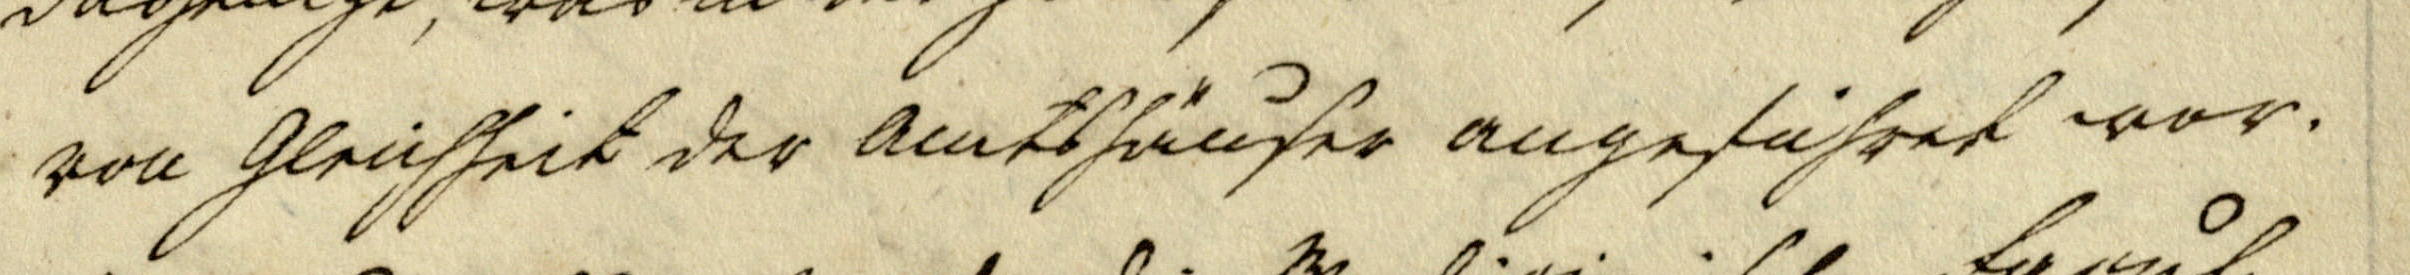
von Gleichheit der Amtshäuser angeführet wor¬
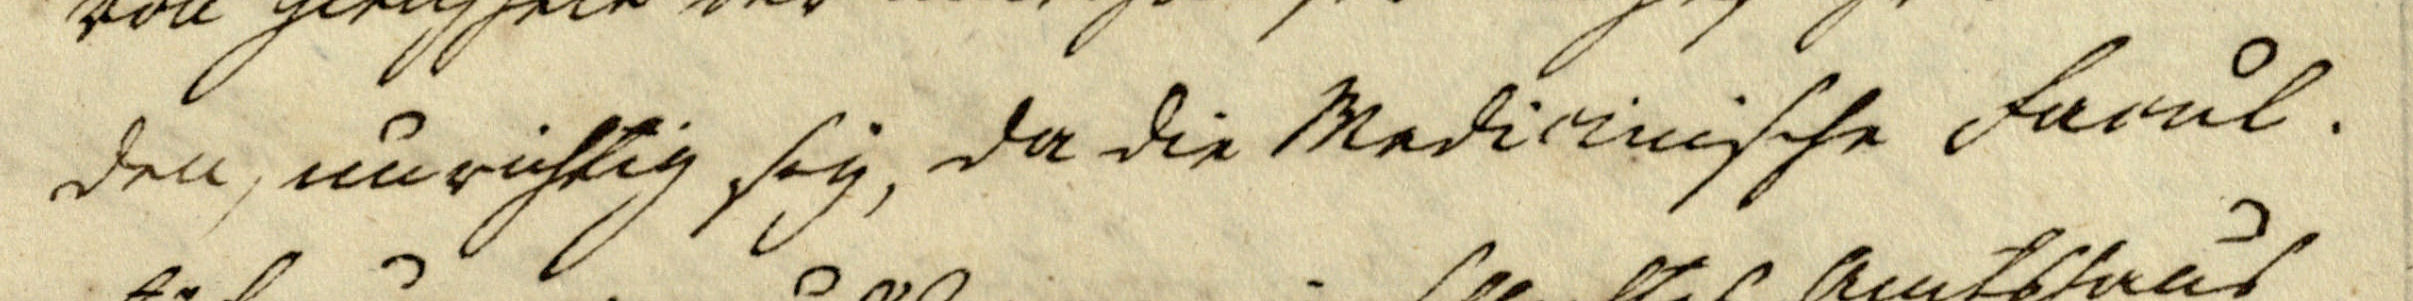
den, unrichtig seÿ, da die Medicinische Facul¬
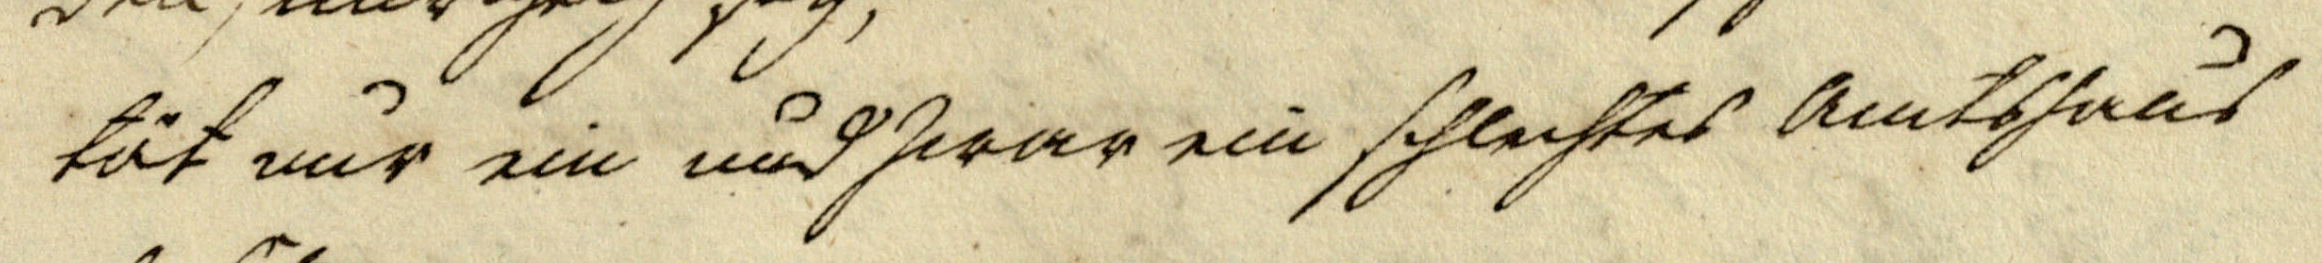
tät nur ein und zwar ein schlechtes Amtshaus
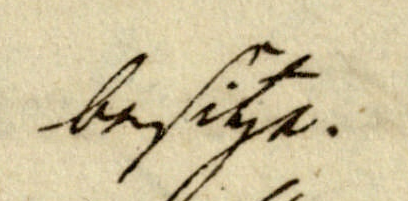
besitze.
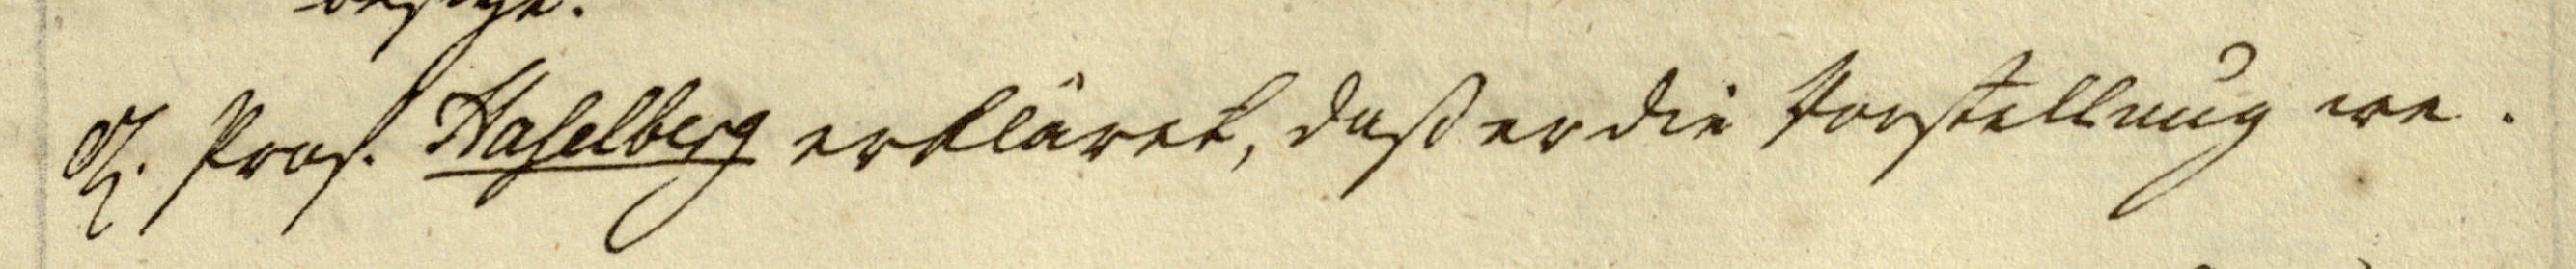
dh. Prof. Haselberg erkläret, daß er die Vorstellung we¬
